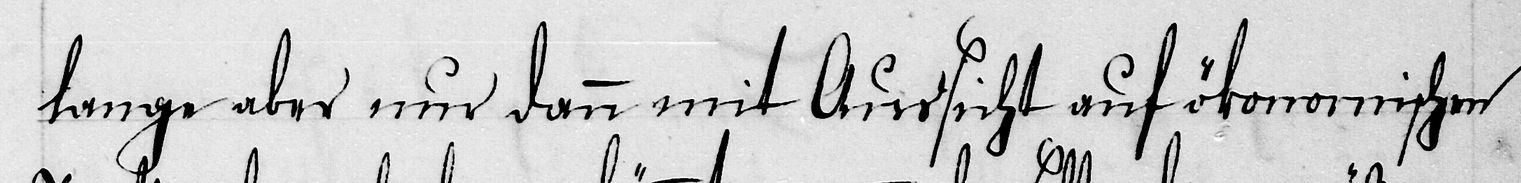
lange aber nur dann mit Aussicht auf ökonomischen
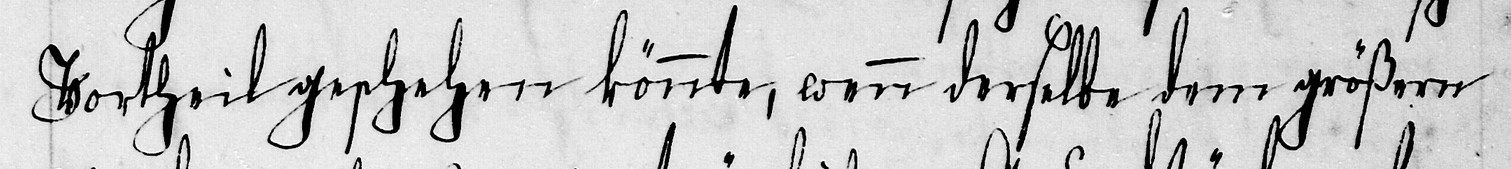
Vortheil geschehen könnte, wenn derselbe dem größern
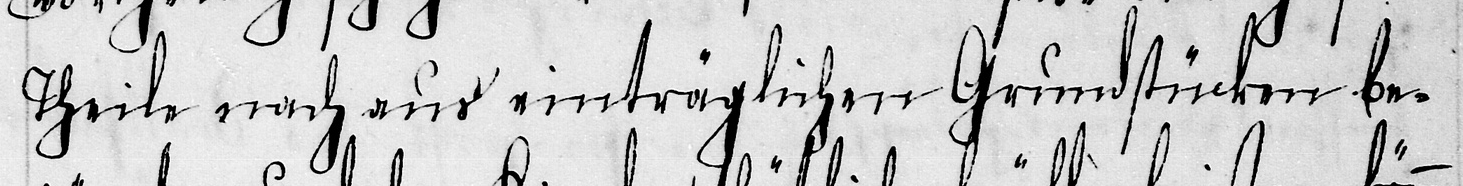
Theile nach aus einträglichen Grundstücken be¬
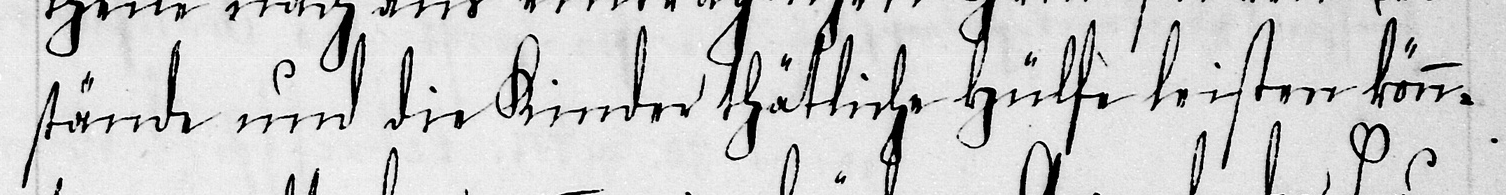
stände und die Kinder thätliche Hülfe leisten könn¬
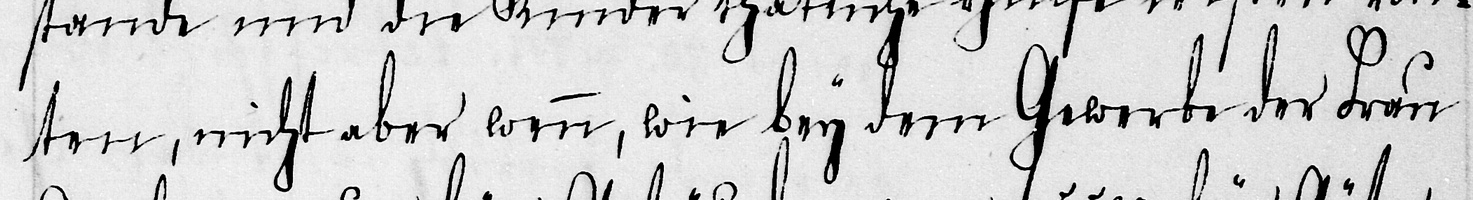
ten, nicht aber wenn, wie bey dem Gewerbe der Frau
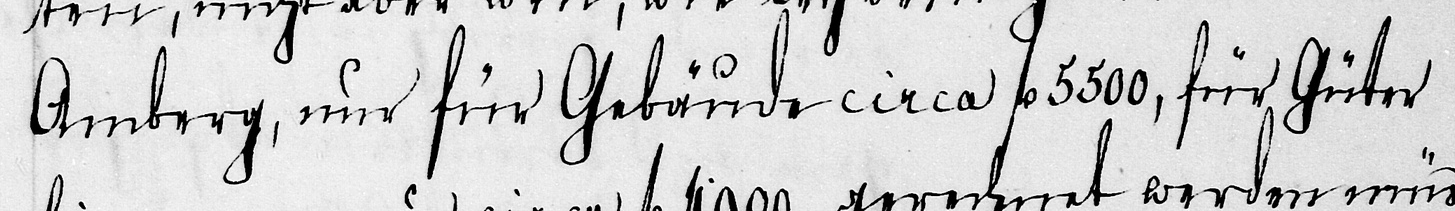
Amberg, nur für Gebäude circa fl. 5500, für Güter
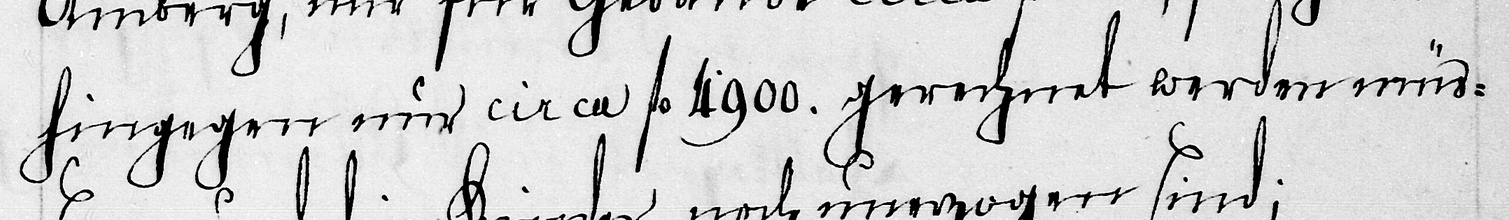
hingegen nur circa fl. 4900, gerechnet werden mü¬
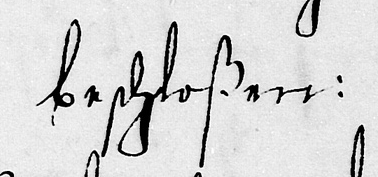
beschloßen:
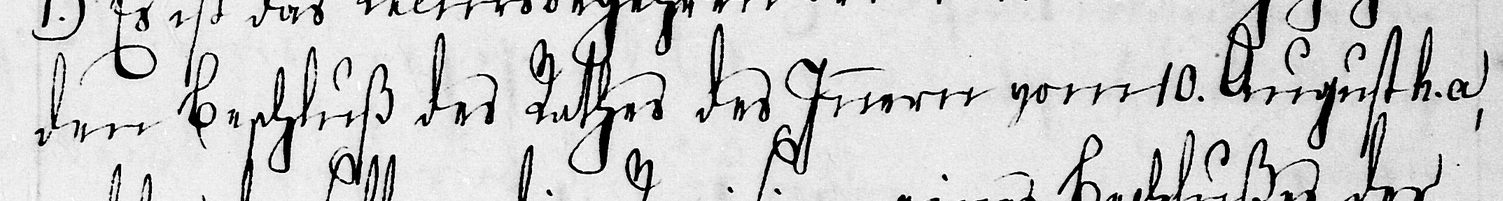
den Beschluß des Rathes des Innern vom 10. August h.
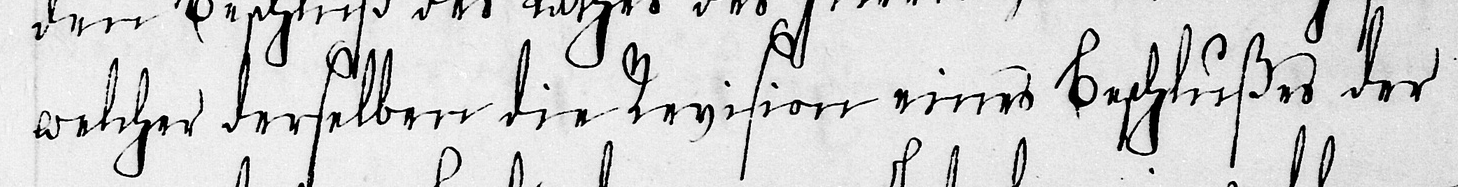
welcher derselben die Revision eines Beschlußes der
